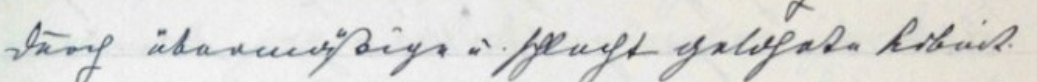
durch übermäßige u. schlecht gelohte Arbeit.
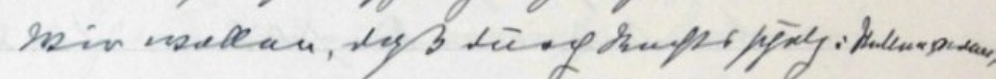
Wir wollen, daß durch Rechtsschutz: Modernisier
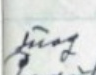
ung
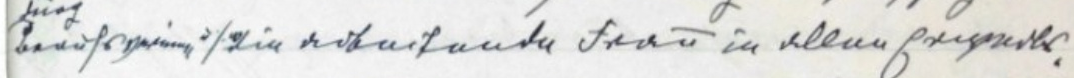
Berufsvereinigungen % die arbeitende Frau in allen Erwerbs
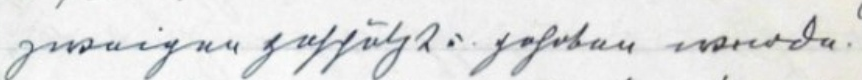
zweigen geschützt u. gehoben werde.
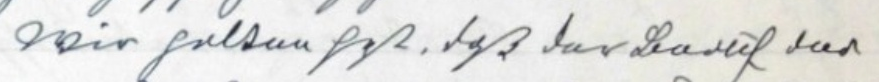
Wir halten fest, daß der Beruf der
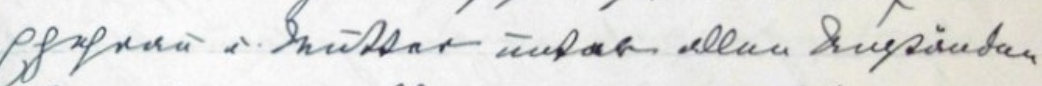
Ehefrau u. Mutter unter allen Umständen
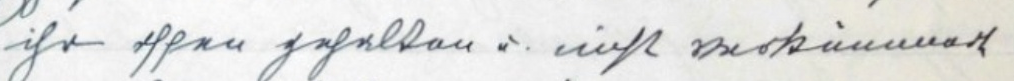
ihr offen gehalten u. nicht verkümmert
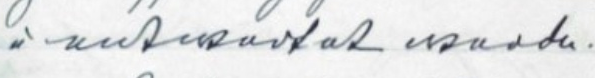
u. entwertet werde.
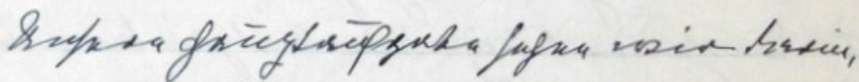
Unsere Hauptaufgabe sehen wir darin,
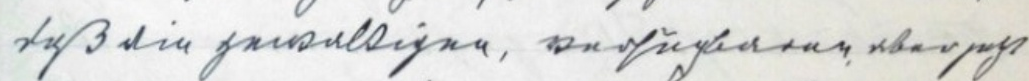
daß die gewaltigen, verfügbaren aber jetzt
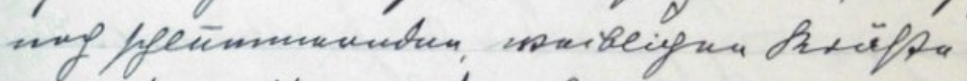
noch schlummernden weiblichen Kräfte
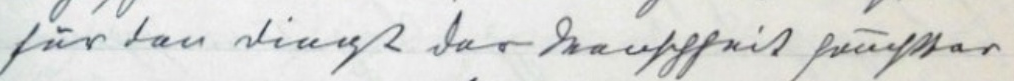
für den Dienst der Menschheit fruchtbar
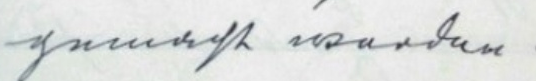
gemacht werden.
